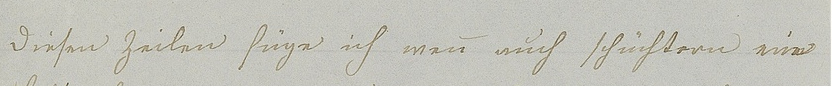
Diesen Zeilen füge ich wenn auch schüchtern eine
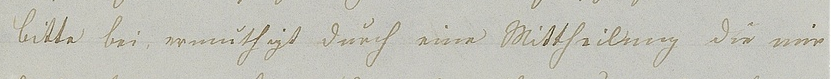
Bitte bei, ermuthigt durch eine Mittheilung die mir
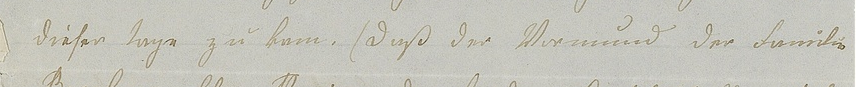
dieser Tage zu kam. (Daß der Vormund der Familie
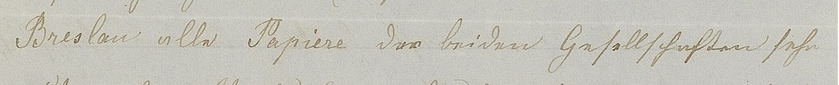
Breslau alle Papiere der beiden Gesellschaften sehr
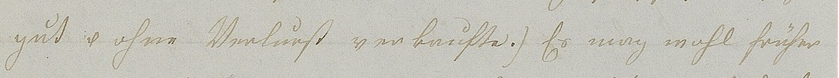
gut & ohne Verlurst verkaufte.) Es mag wohl früher
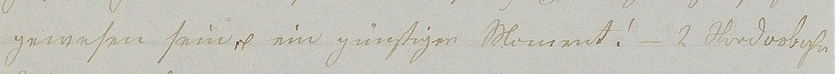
gewesen sein & ein günstiger Moment! – 2 Nordostbahn
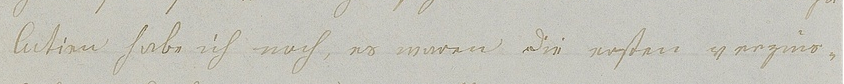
Actien habe ich noch, es waren die ersten verzins-
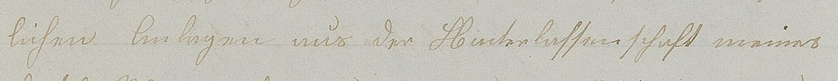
lichen Anlagen, aus der Hinterlassenschaft meines
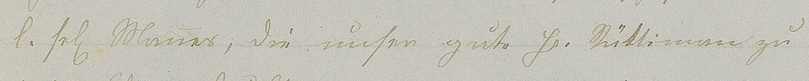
l. seligen Mannes, die unser guter Hr. Rüttiman zu
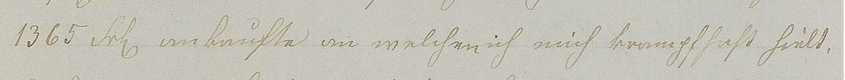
1365 Franken ankaufte an welchen ich mich krampfhaft hielt.
